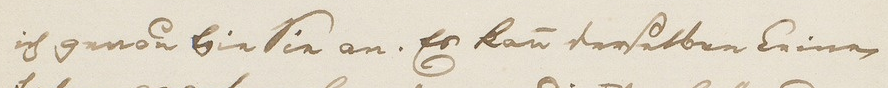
ich genau wie Sie an. Es kann derselben keine
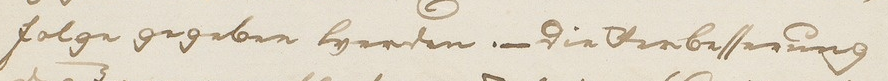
Folge gegeben werden. – Die Verbesserung
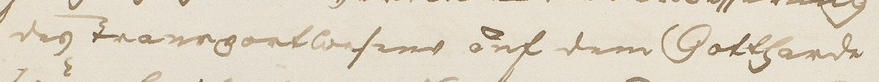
des Transportwesens auf dem Gottharde
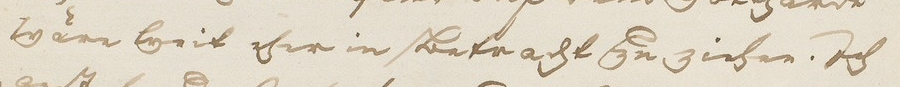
wäre weit eher in Betracht zu ziehen. Ich
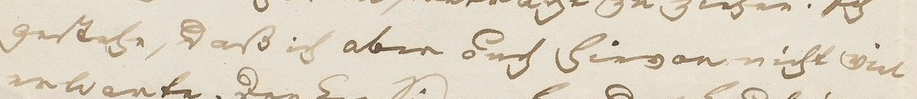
gestehe, daß ich aber auch hievon nicht viel
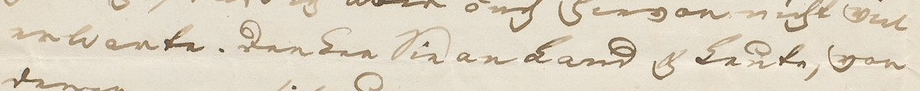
erwarte. Denken Sie an Land & Leute, von
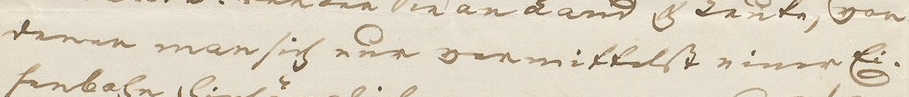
denen man sich nur vermittelst einer Ei-
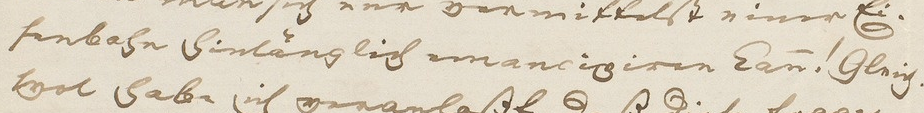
senbahn hinlänglich emancipiren kann! Gleich-
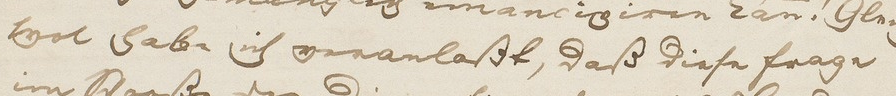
wol habe ich veranlaßt, daß diese Frage
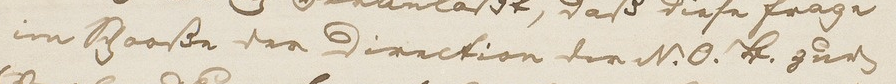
im Schooße der Direction der N.O.B. zur
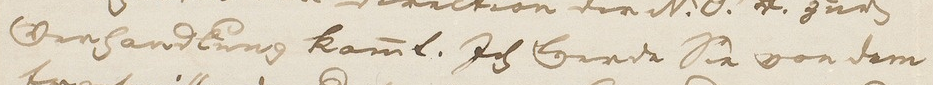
Verhandlung kommt. Ich werde Sie von dem
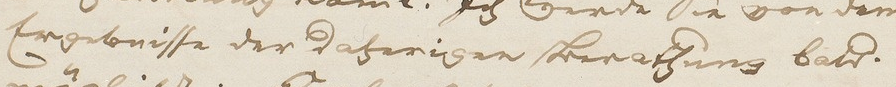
Ergebnisse der daherigen Berathung bald-
